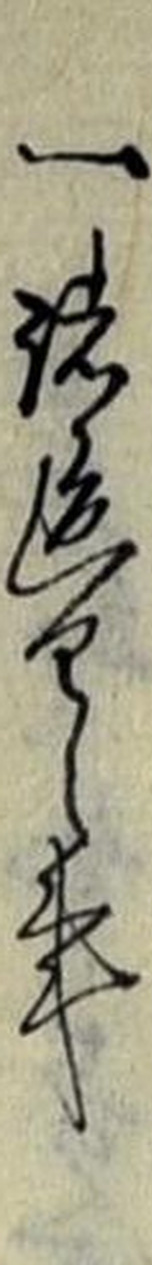一諸道具之事
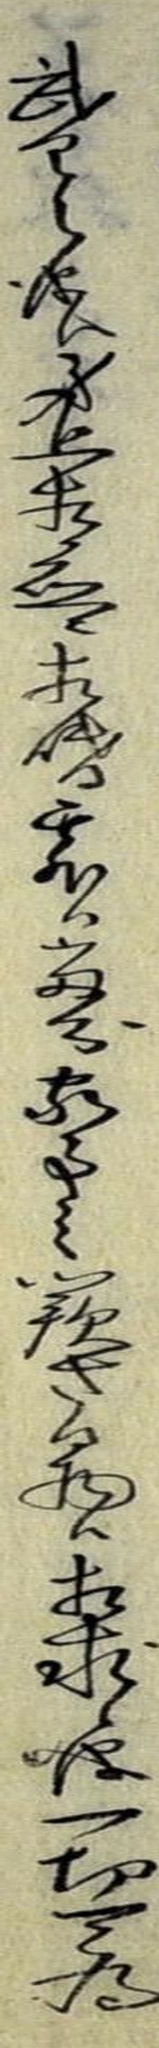武具之儀ハ身上相応ニ相替其外ハ当分家事之闕さる物ハ相求候儀一切可為
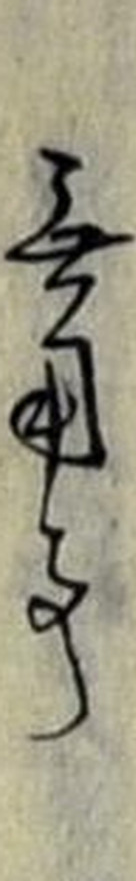無用事
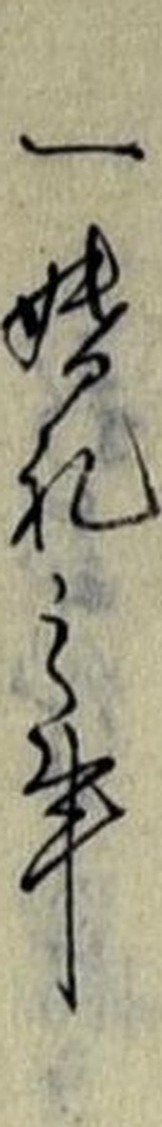一婚礼之事
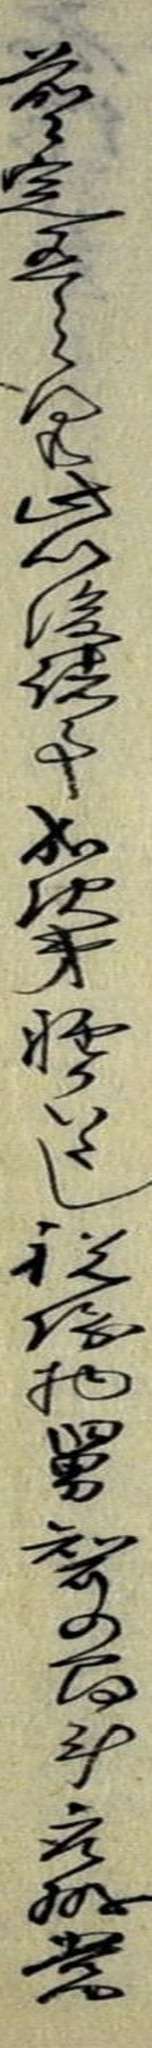前々定有之候得共此以後諸事成次第軽クいたし祝儀物舅聟の間斗取扱当
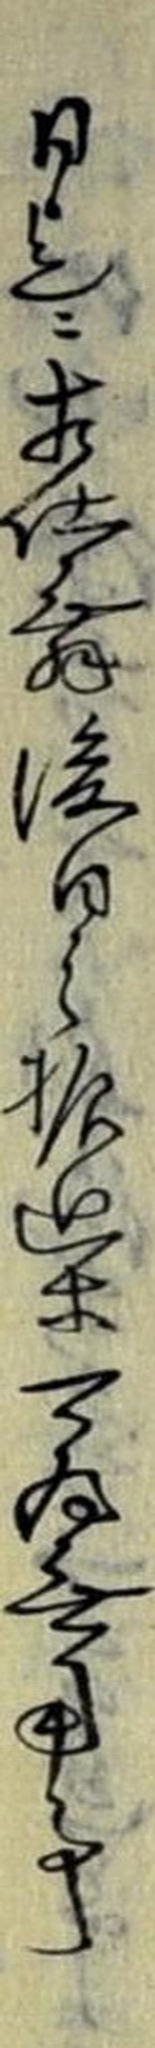日迄ニ相仕舞後日之振廻等可為無用事
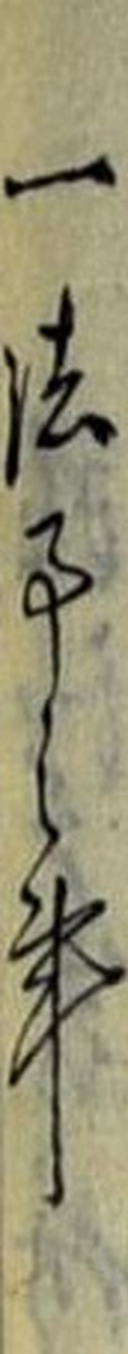一法事之事
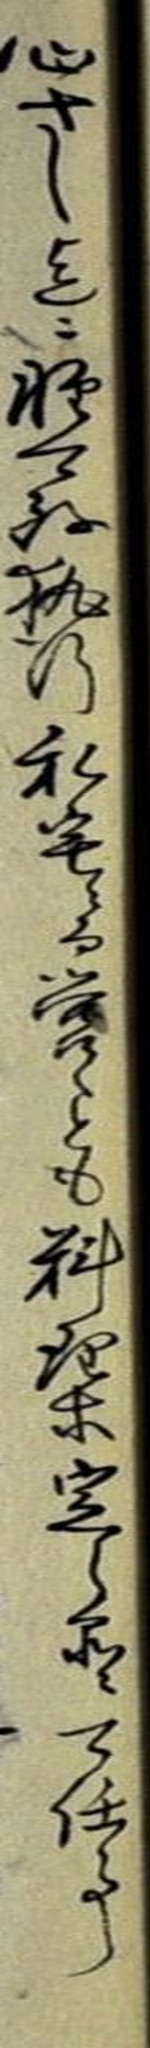心さし迄ニ軽可致執行私宅ニ而営候とも料理等定之品ニ可任事
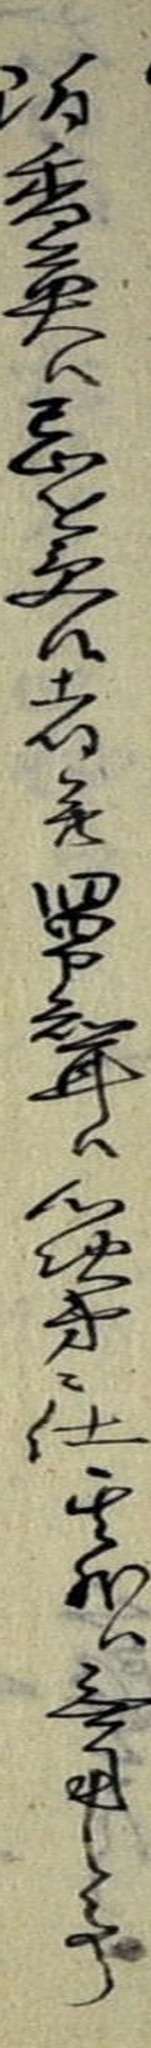附香奠ハ忌を受候者并舅聟ハ心次第ニ仕其外ハ無用之事
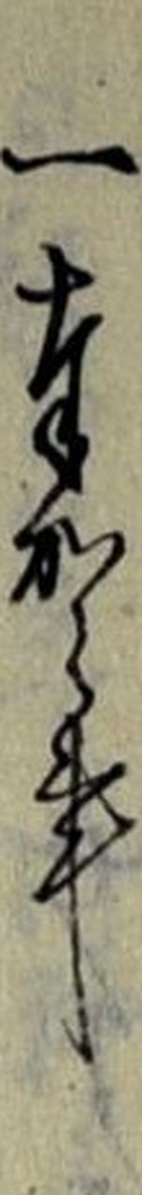一奉加之事
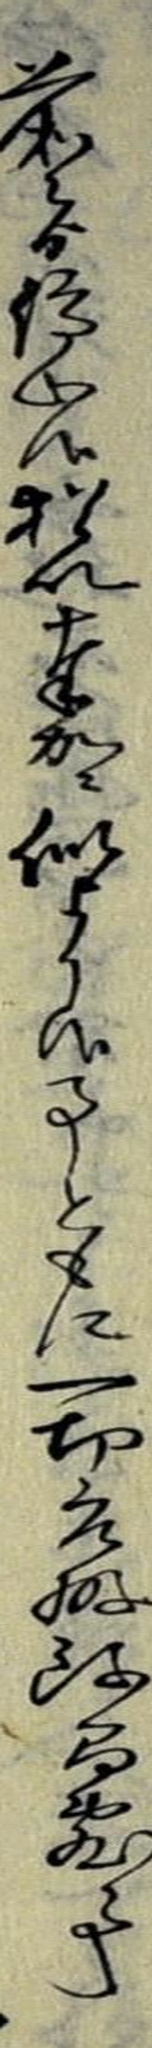前々ゟ停止候猶以奉加ニ似より候事ともに一切取扱致間敷事
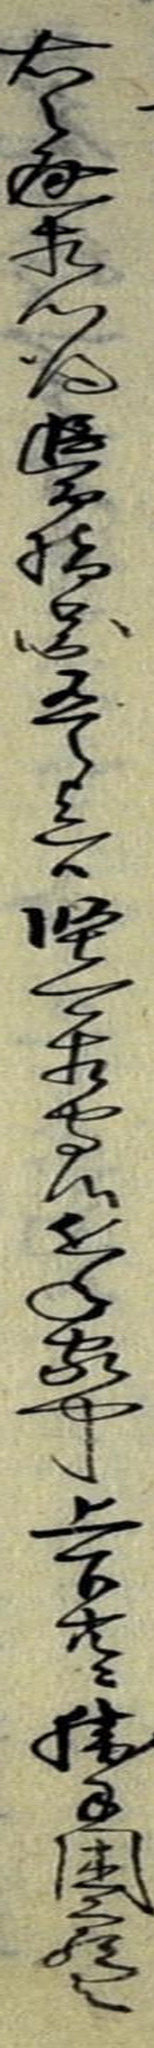右之通相心得追而指図有之迄ハ堅可相守候近年家中上下共ニ勝手困窮之
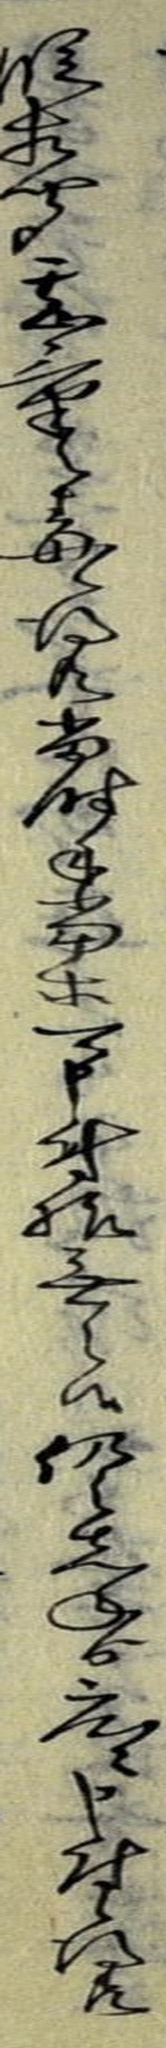段相聞甚気之毒候得共当時手当等可申付様無之候仍之先年ゟ度々申付候得共
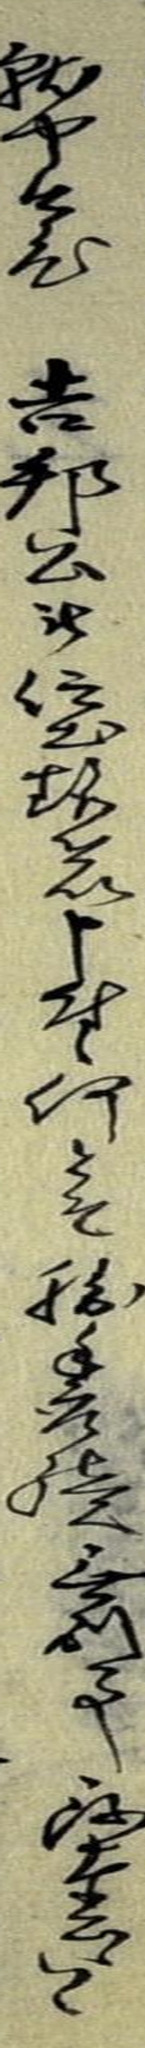就中今度吉邦公被仰出趣を以申付候何とそ勝手取続無別事致奉公候ハヽ
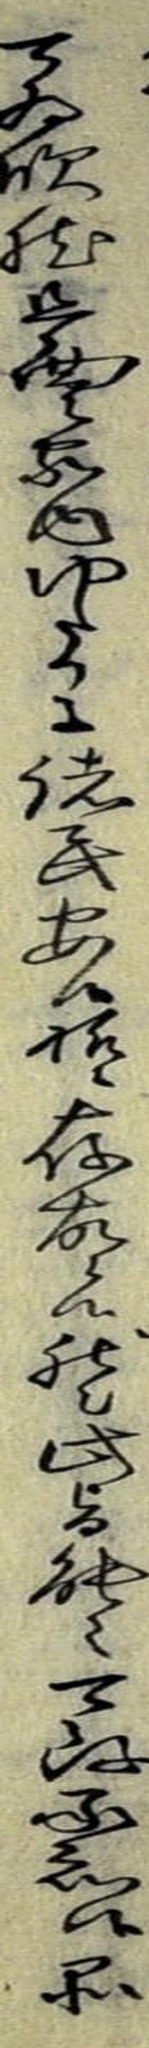可為欣然且面々家内ゆたかに諸民安候様ニ存故ニ候然し此旨能々可致承知候品
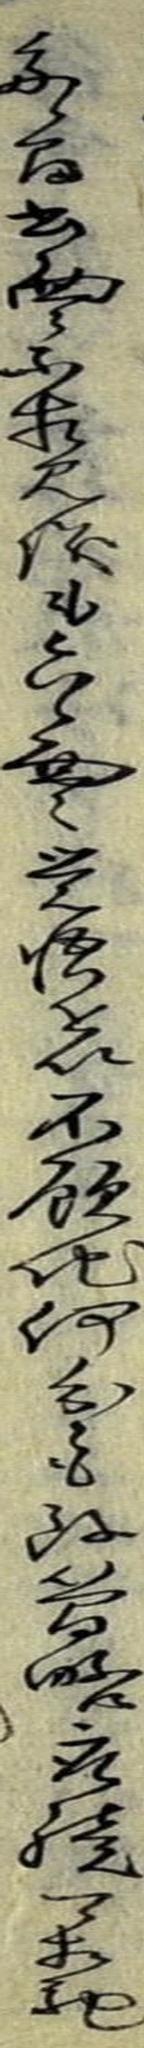多候間書面ニ不相見儀も候ハヽ面々覚悟を以不願他何分ニも致簡略取続可相勤候
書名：命令之部 一
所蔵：福井県文書館 Fukui Prefectural Archives
